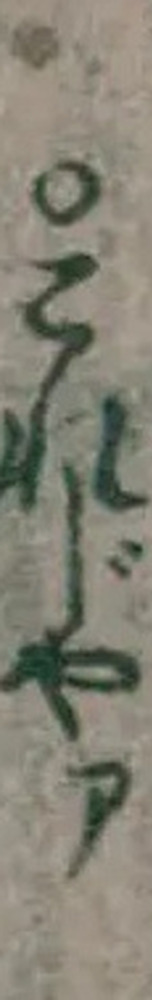〇これぢゃァ
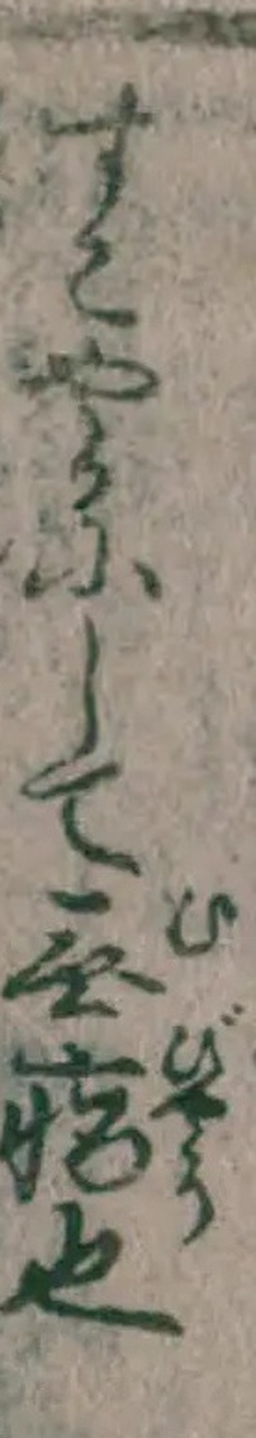すこやかにして無病也
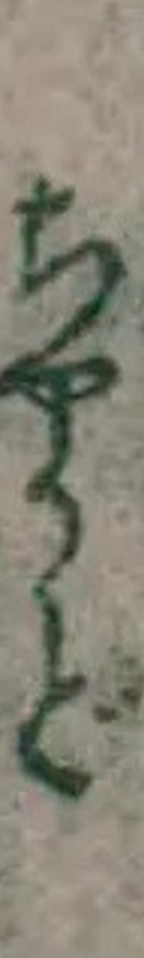ちやうど
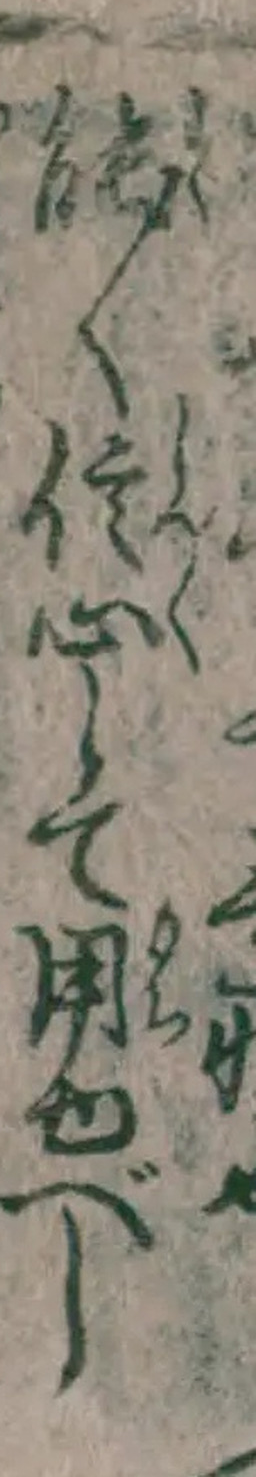能〳〵信心して用ゆべし
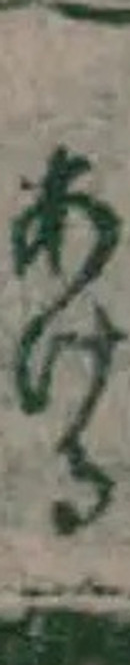あける
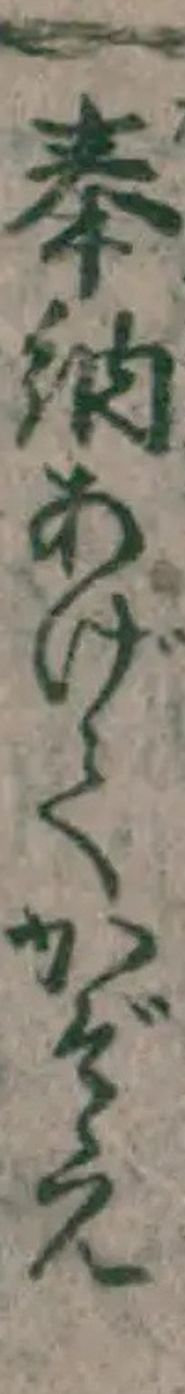奉納あげてかぞへ
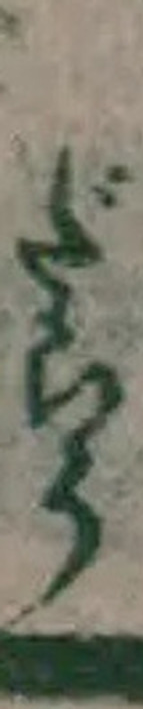だらう
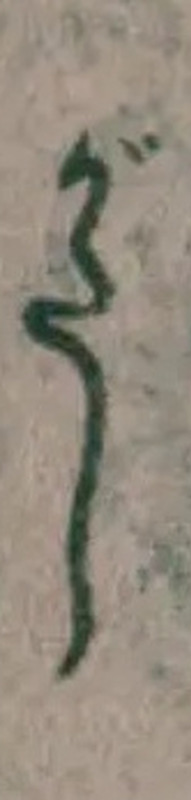がたし
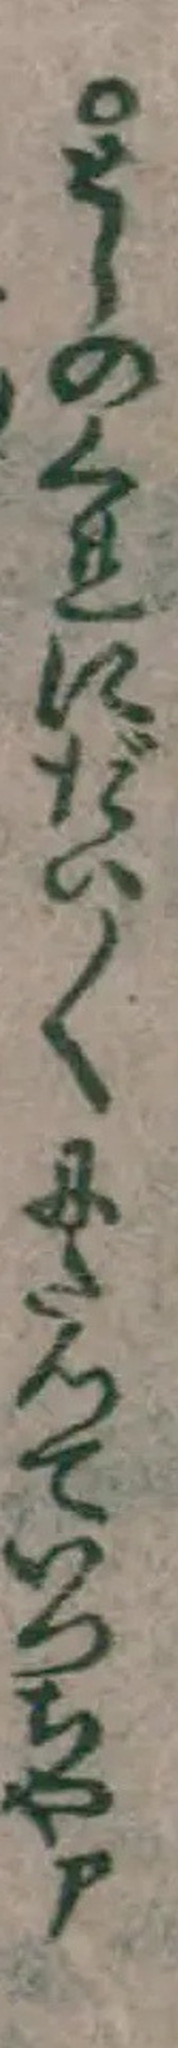〇としのくれにだい〳〵にたつていつちやァ
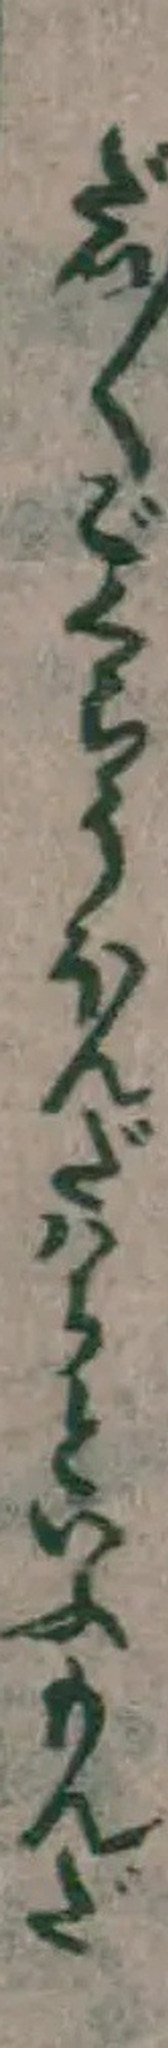だい〳〵ごくらうほんだはらといふもんだ
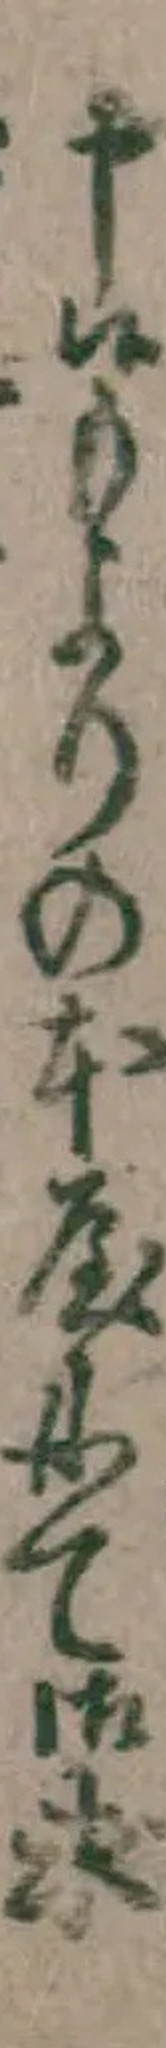申候もよりの本屋にて御求
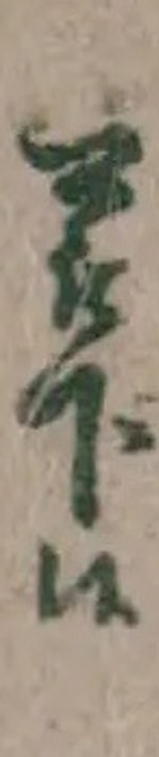可被下候
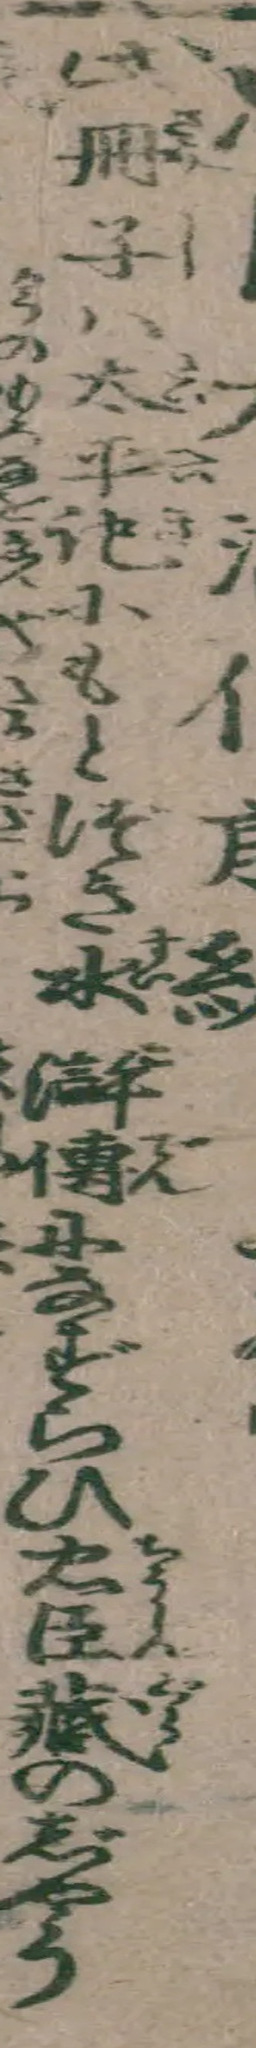此冊子は太平記にもとずき水滸伝になぞらひ忠臣蔵のじやう
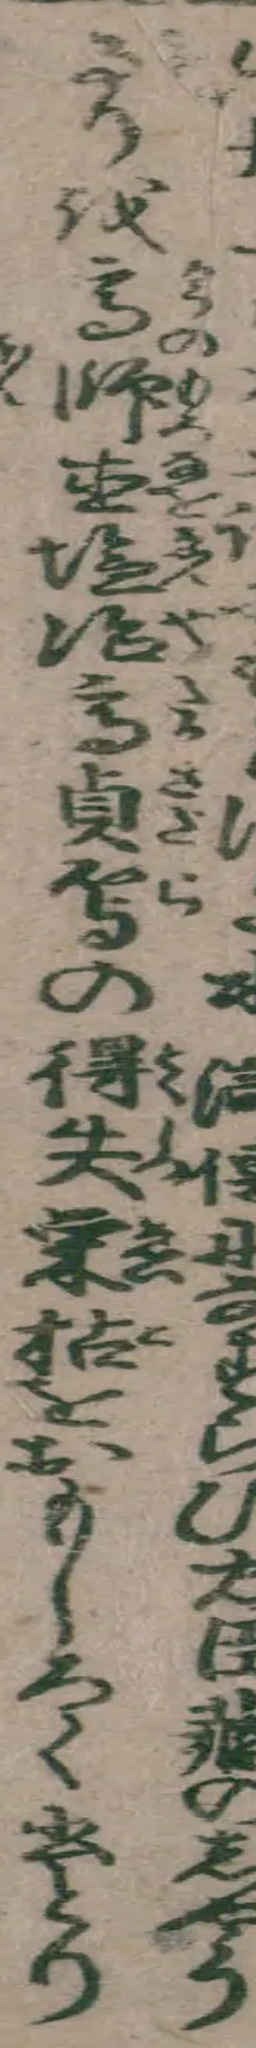るりを高師直塩冶高貞等の得失栄枯をおもしろく出とり
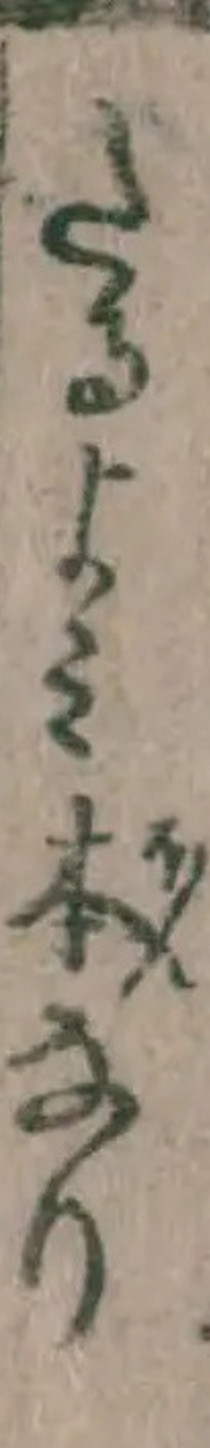たるよみ本なり
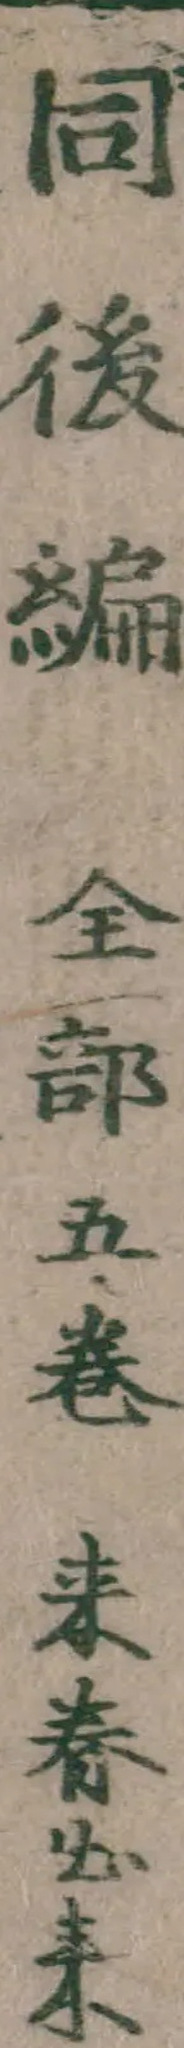同後編全部五巻来春出来
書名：視薬霞報条 3巻
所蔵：国立国会図書館 National Diet Library, JAPAN
